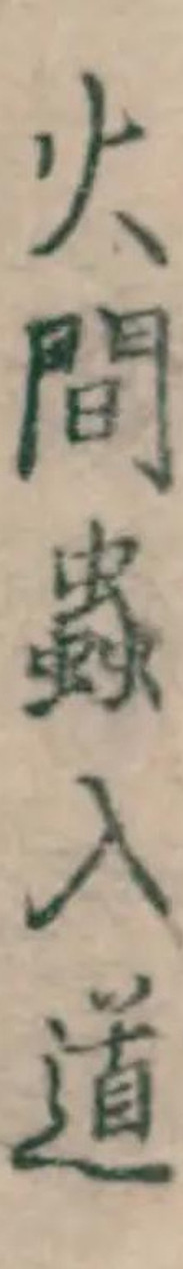火間虫入道
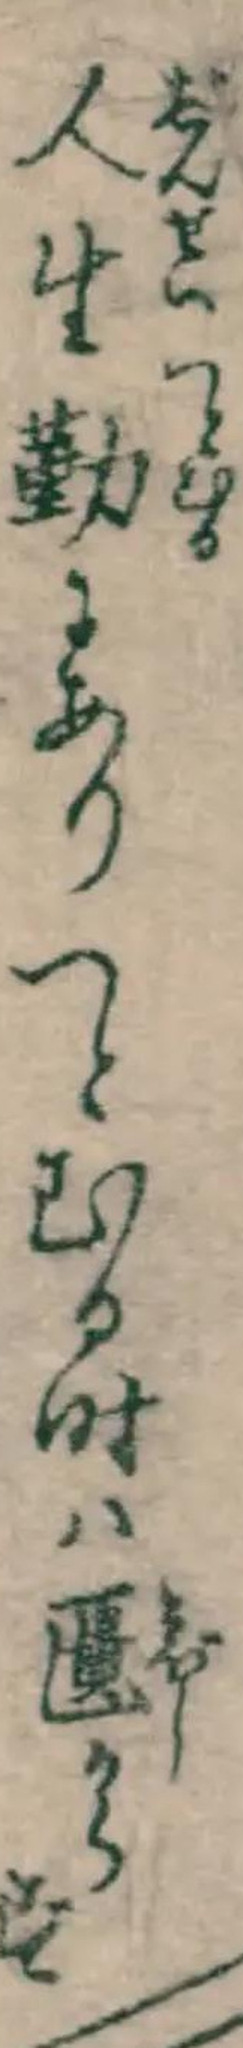人生勤にありつとむる時は匱からず
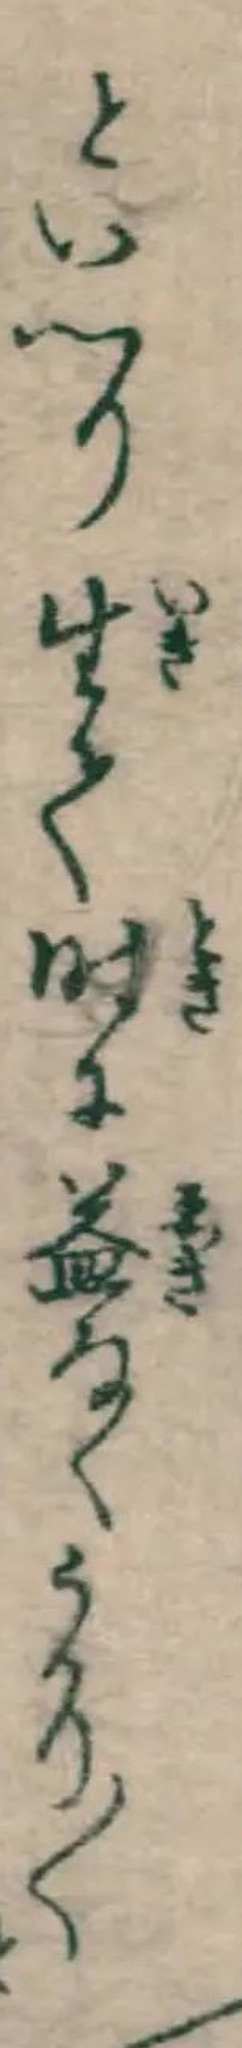といへり生て時に益なくうかり〳〵と
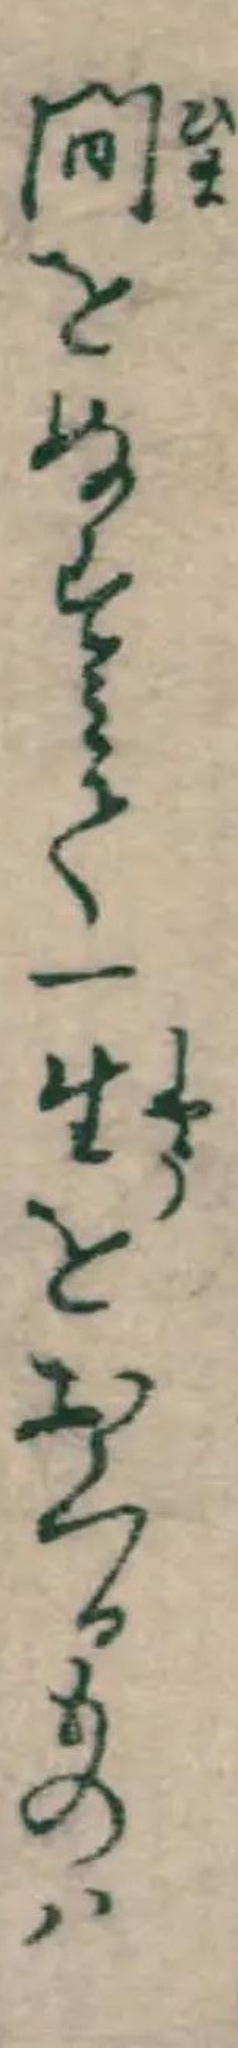間をぬすみて一生をおくるものは
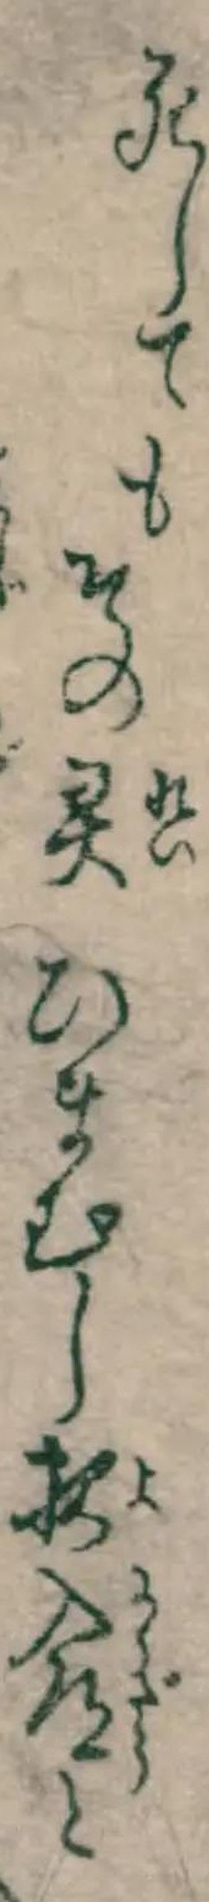死してもその霊ひまむし夜入道と
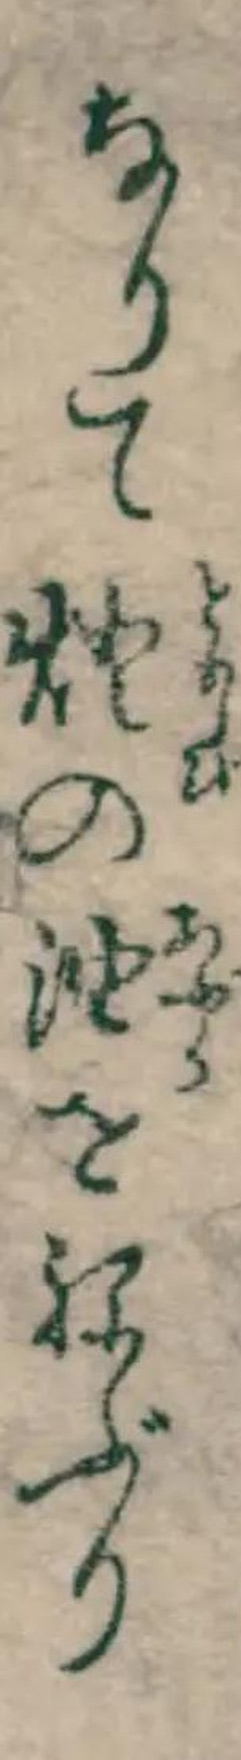なりて灯の油をねぶり
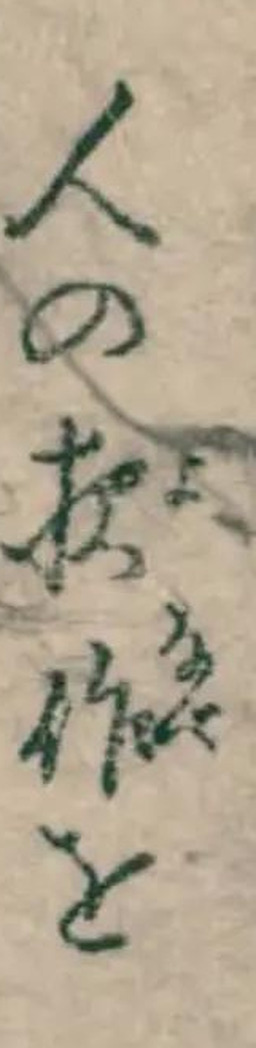人の夜作を
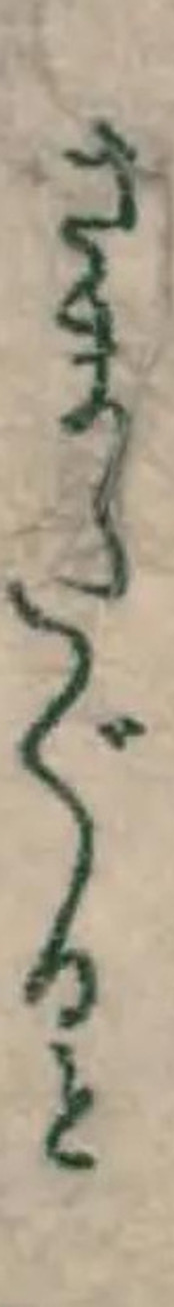さまたぐると
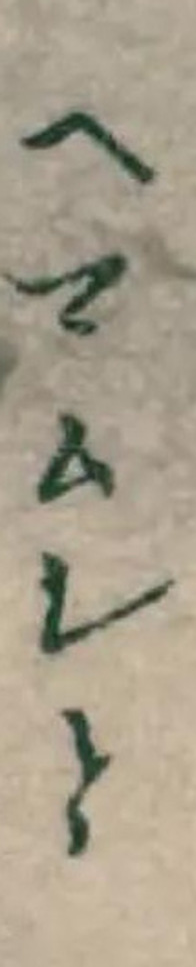ヘマムシと
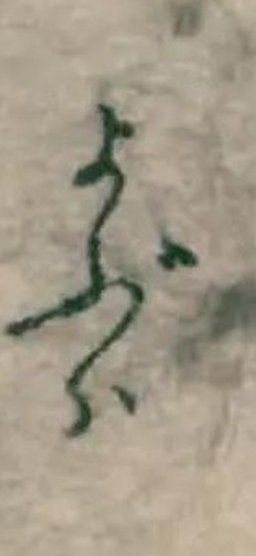よぶは

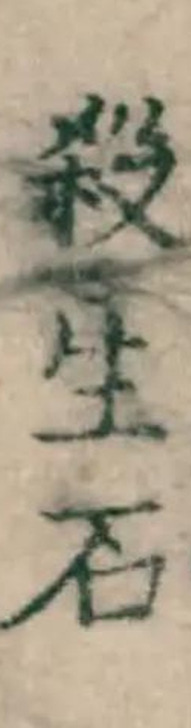殺生石
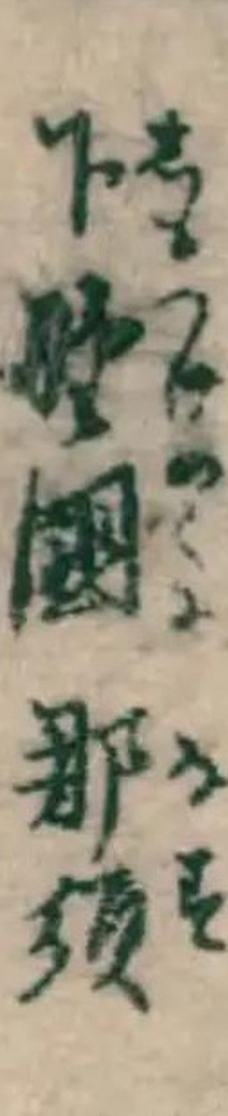下野国那須
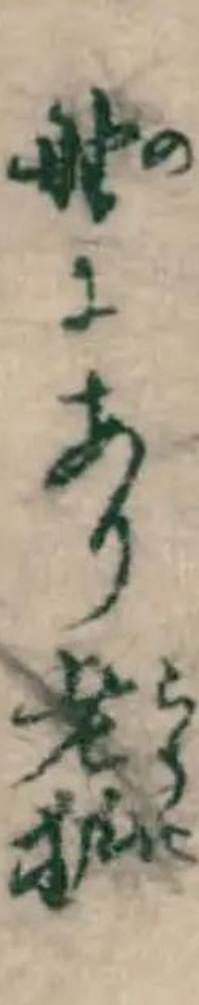野にあり老狐
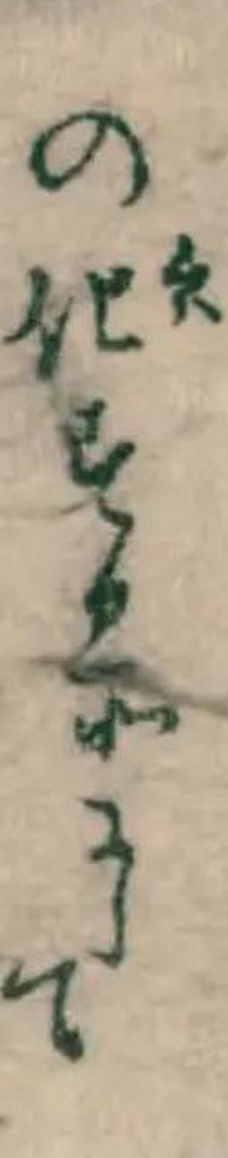の化する所にして
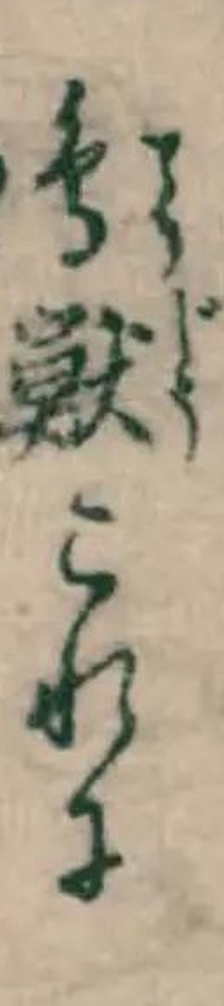鳥獣これに
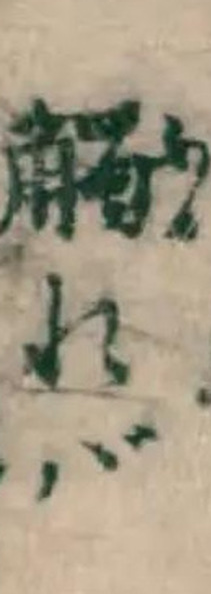触れば
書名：百鬼夜行 3巻拾遺3巻. [2]
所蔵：国立国会図書館 National Diet Library, JAPAN
